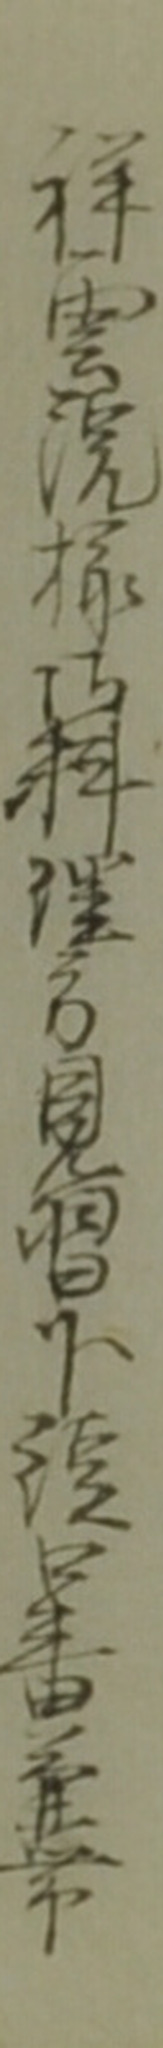祥雲院様料理方見習下錠口番兼帯
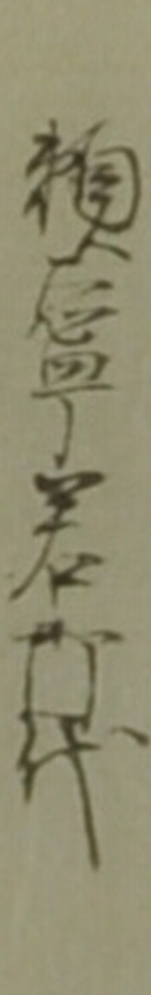頼以君御代
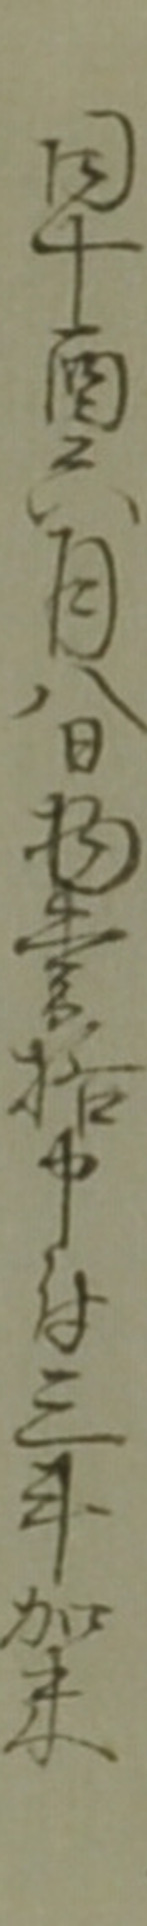一同十酉六月八日物書格申付三斗加米
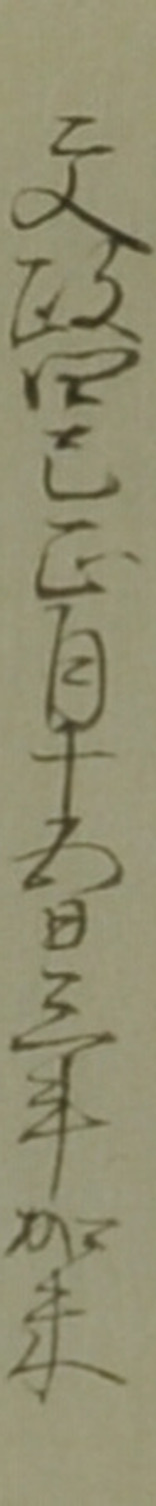一文政四巳正月十五日三斗加米
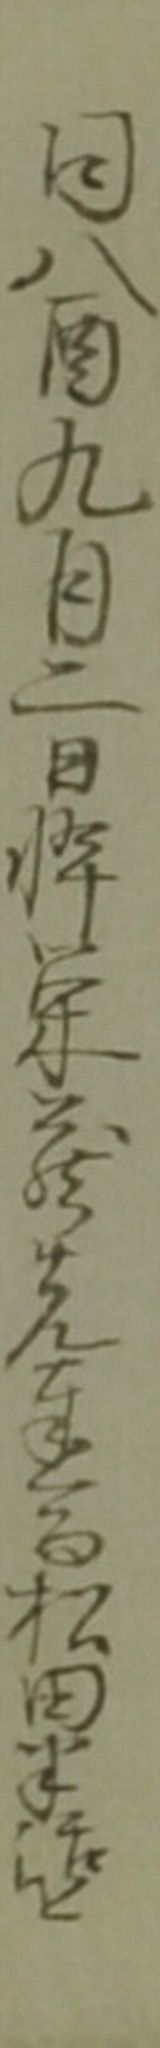一同八酉九月二日忰栄蔵先達而松田半治を
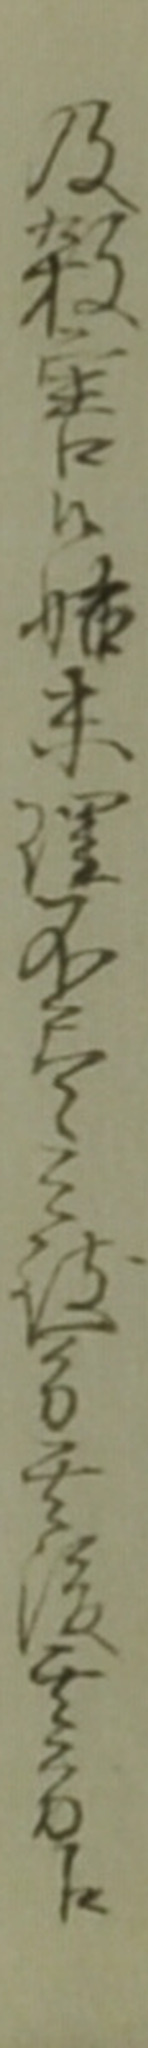及殺害候始末理不尽之致一方其後其方江
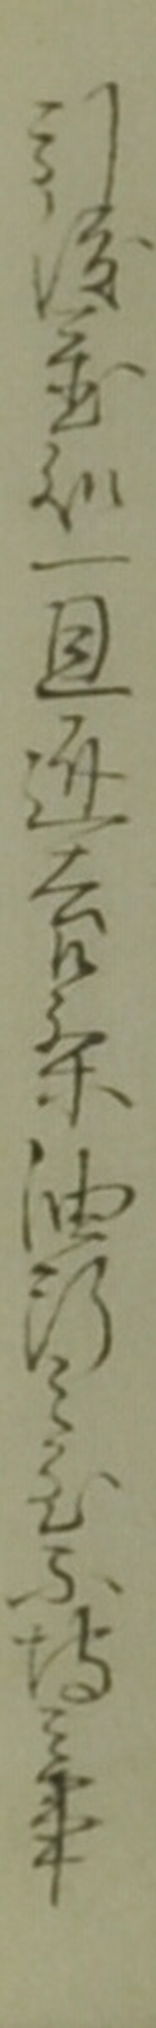引渡置処一旦逃去候条油断之至不埒之事
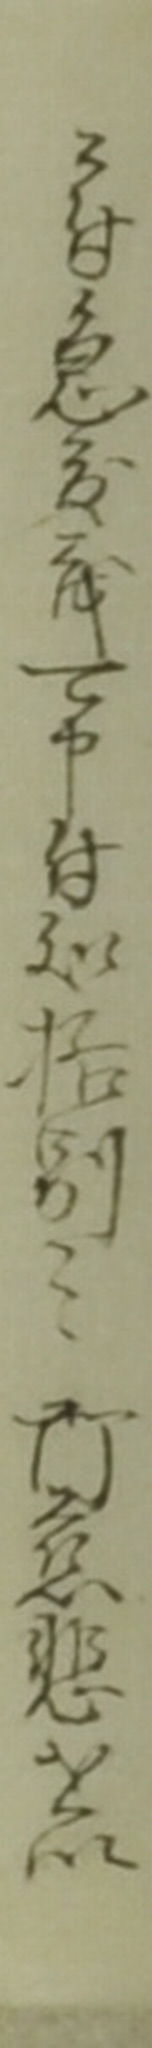二付急度茂可申付処格別之御慈悲を以

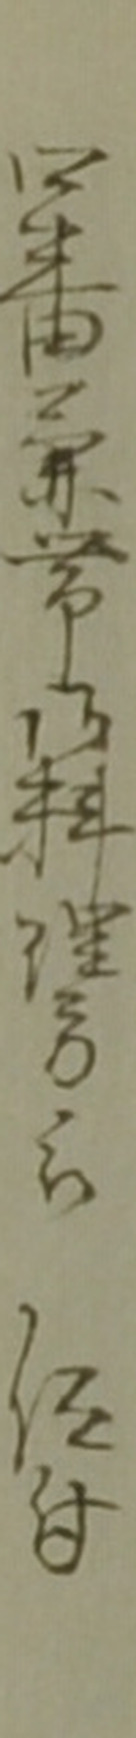口番兼帯御料理方被仰付
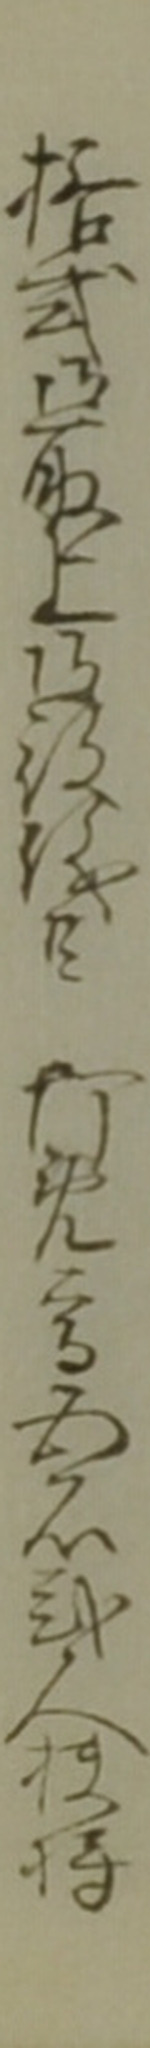格式御取上御役儀共御免高五石弐人扶持
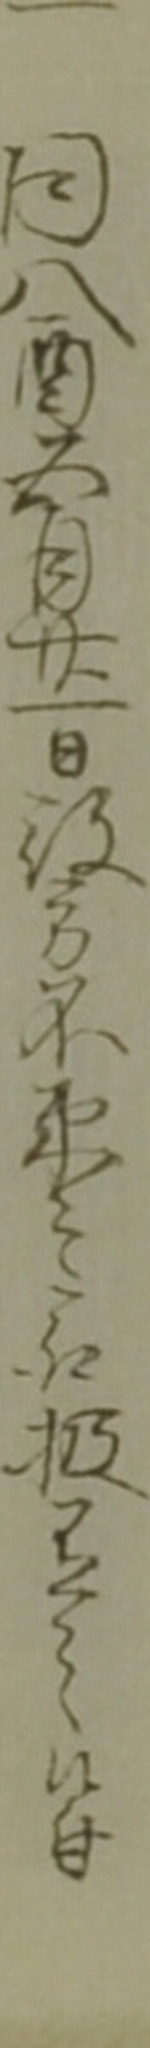一同八酉五月廿一日役方不束之取扱有之候付
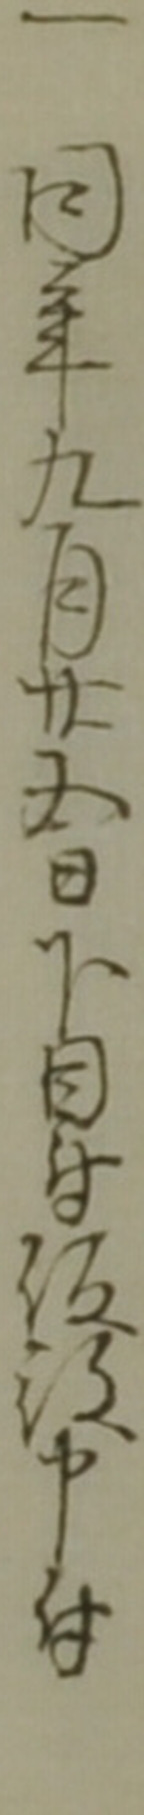一同年九月廿五日下目付仮役申付
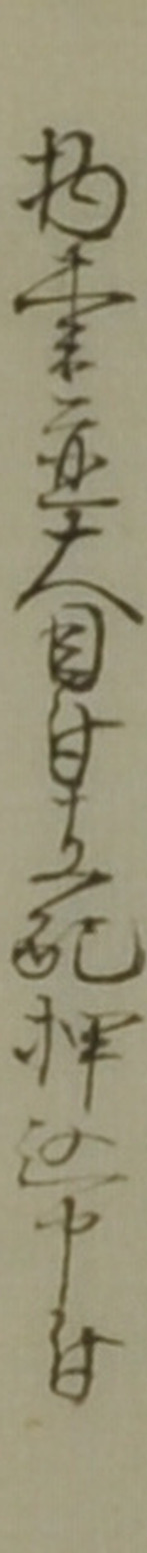物書並大目付支配押込申付
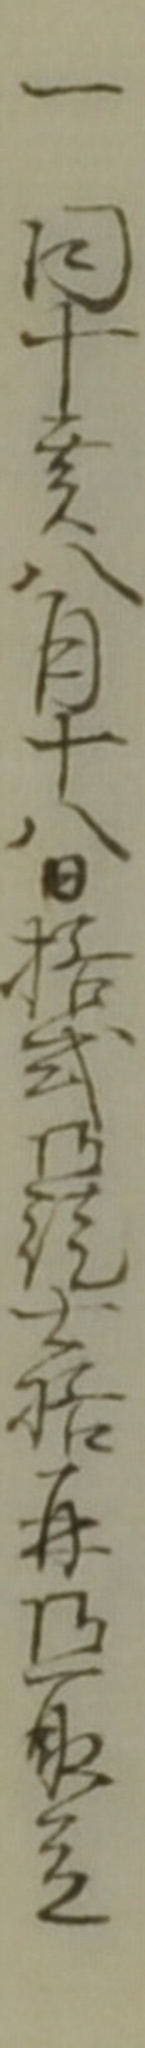一同十亥八月十八日格式御徒士格再御取立
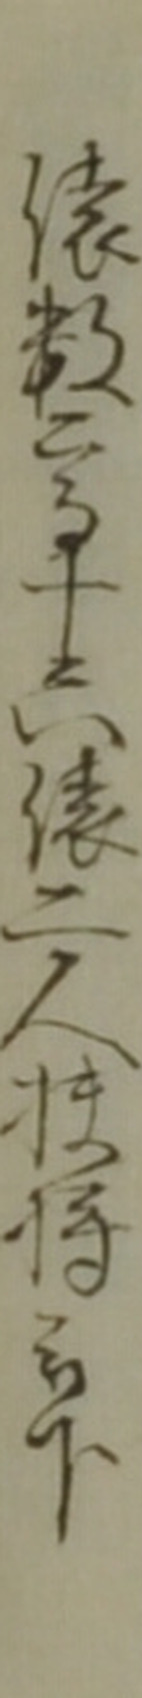俵数高十六俵二人扶持被下
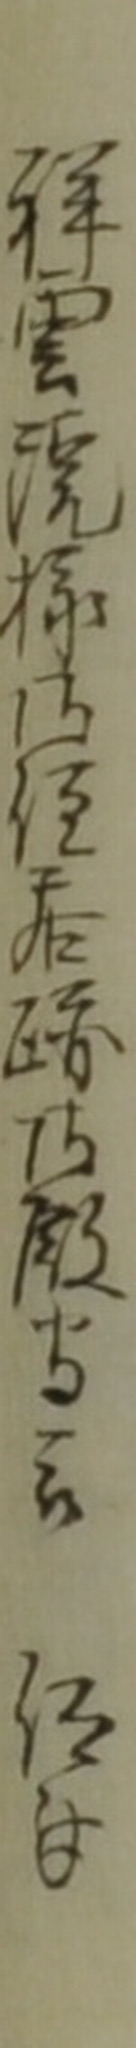祥雲院様御住居跡御殿守被仰付
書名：無足諸士勤仕録（七）
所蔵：伊那市立高遠町図書館・合同会社AMANE
